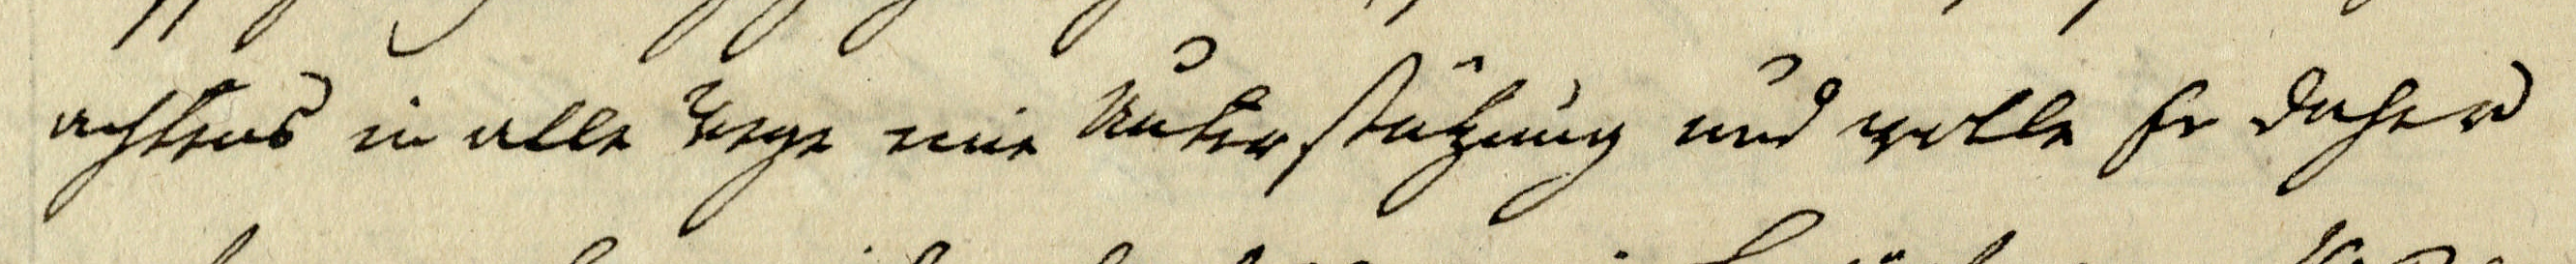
achtens in alle Wege eine Unterstützung und wolle Er daher
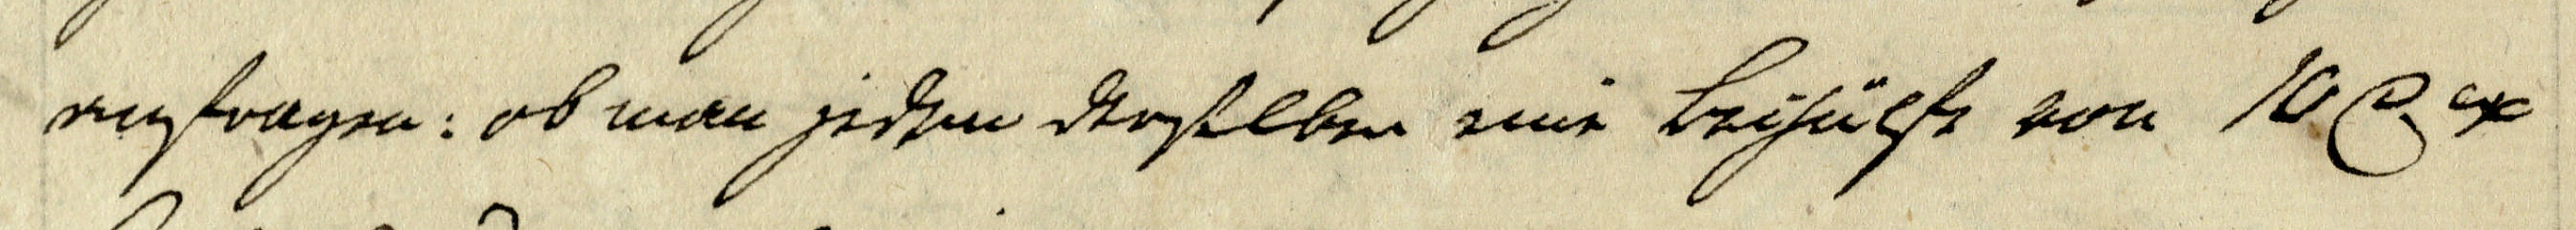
anfragen: ob man jedem derselben eine Beihülfe von 10l ex
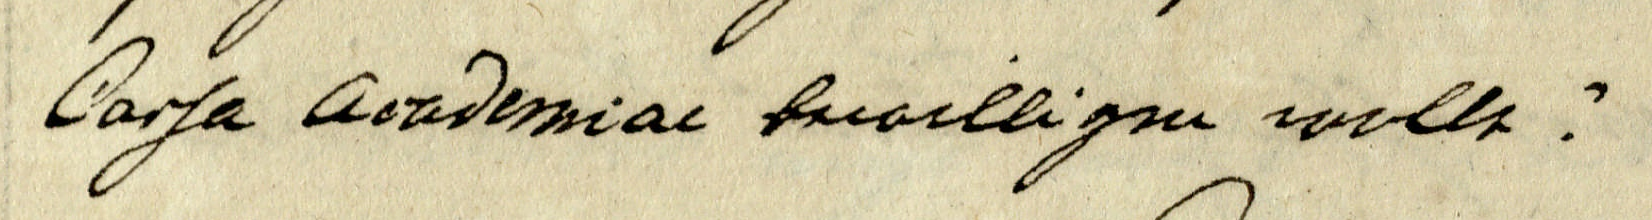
Cassa Academiae bewilligen wolle?
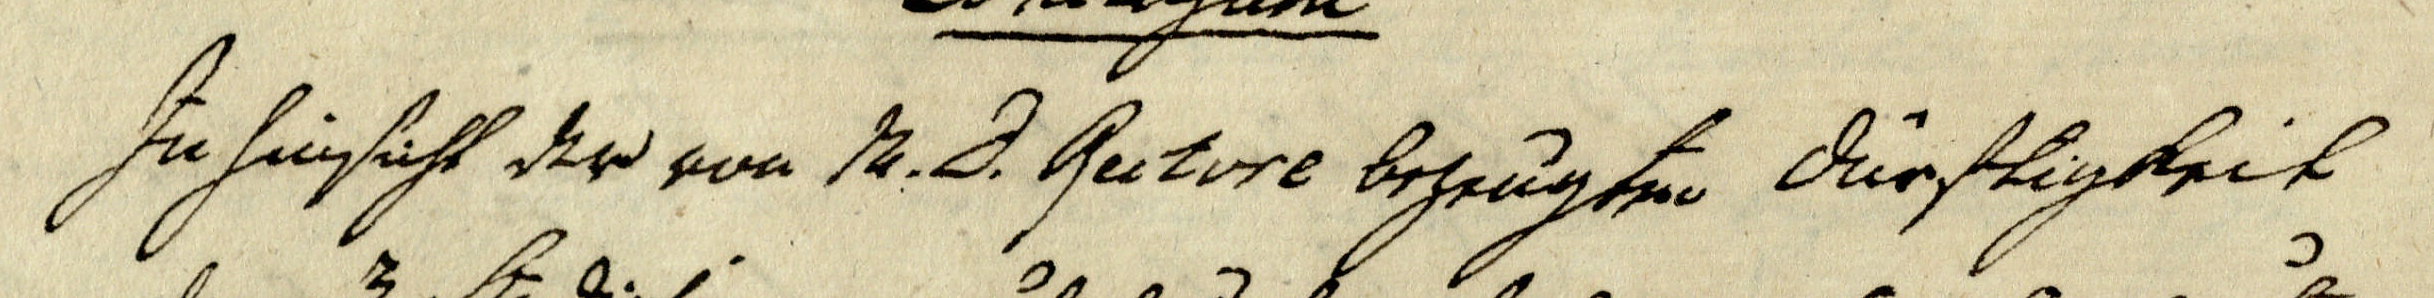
In Hinsicht der von M. D. Rectore bezeugten Dürftigkeit
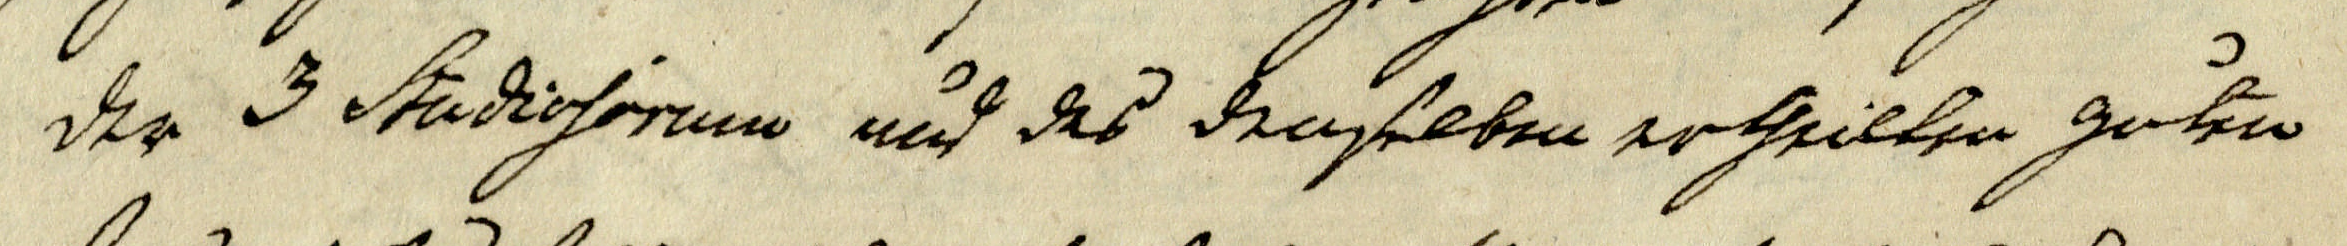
der 3 Studiosorum und des denselben ertheilten guten
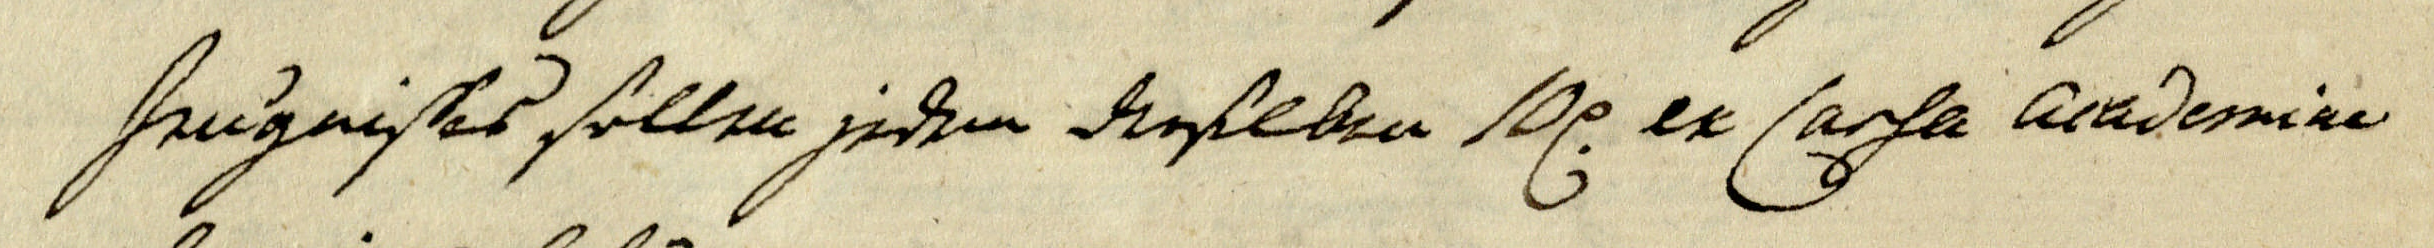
Zeugnisses sollen jedem derselben 10 l. ex Cassa Academie
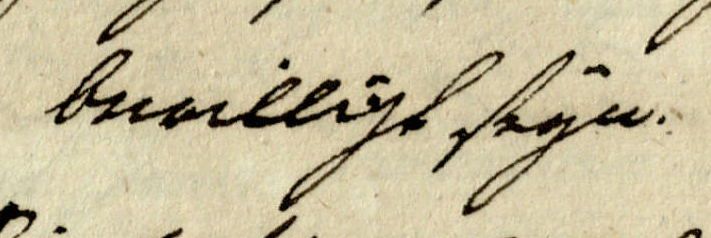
bewilligt seÿn.
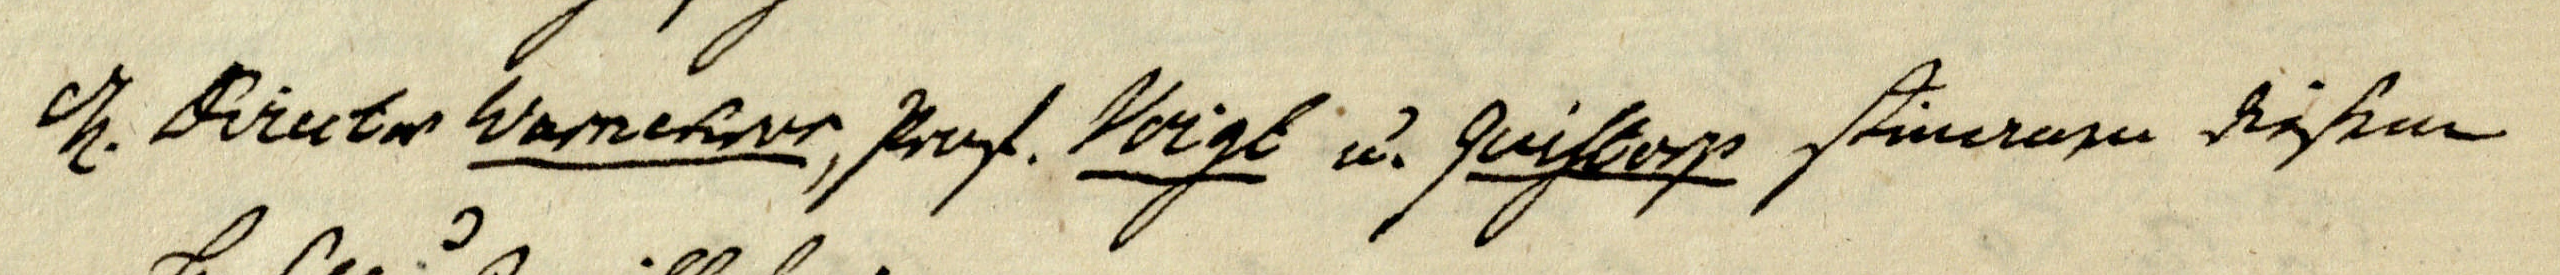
dh. Director Warnekros, Prof. Voigt u. Quistorp. stimmen diesem
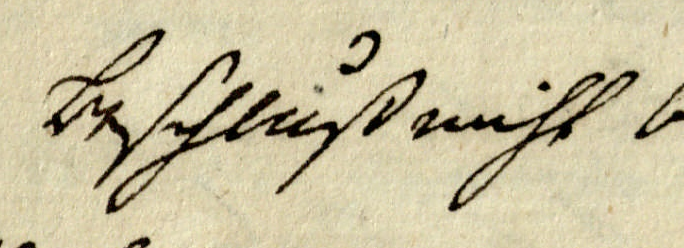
Beschluß nicht bei.
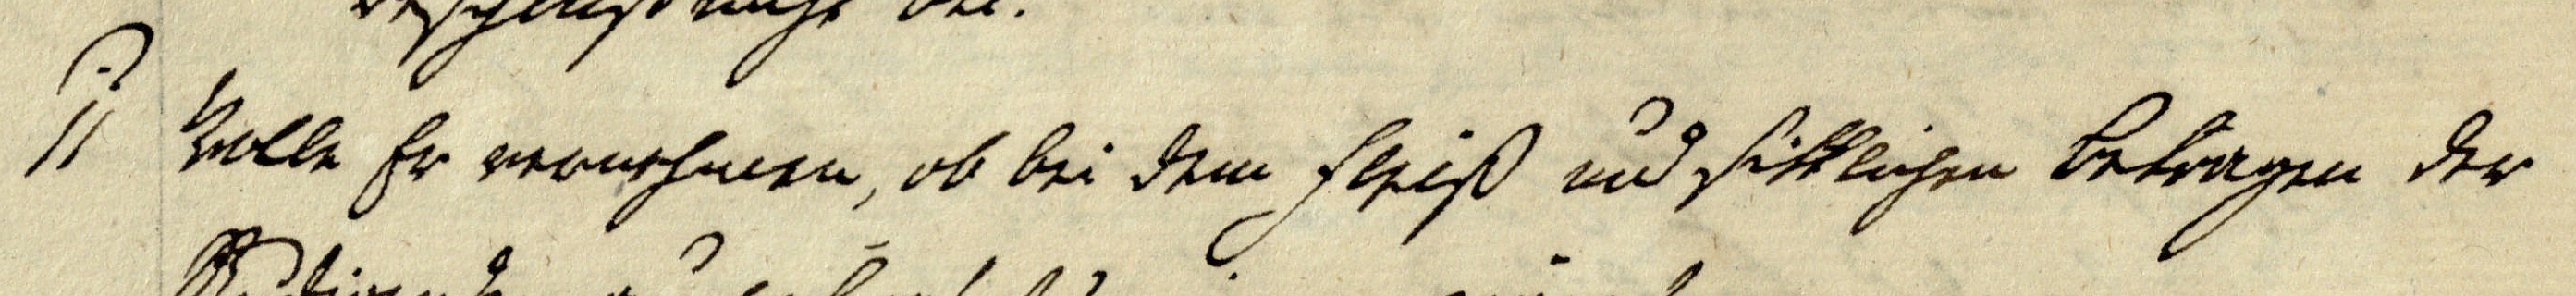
11. Wolle Er vernehmen, ob bei dem Fleiß und sittlichen Betragen der
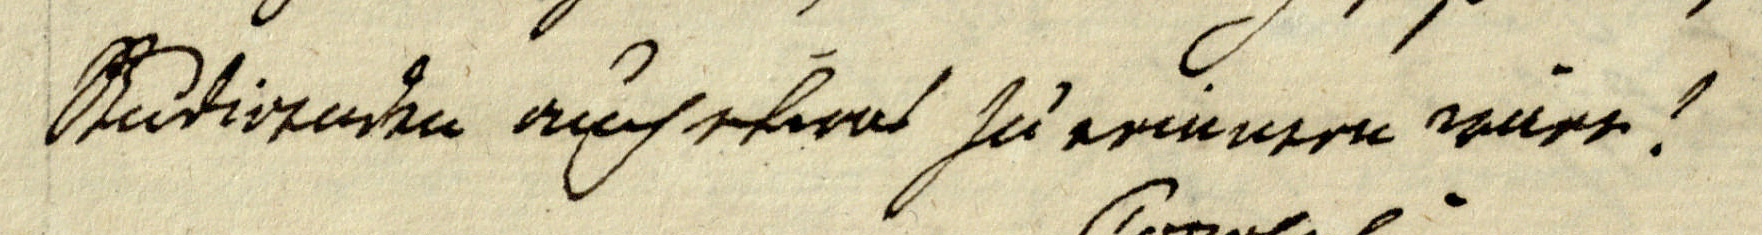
Studirenden auch etwas zu erinnern wäre?
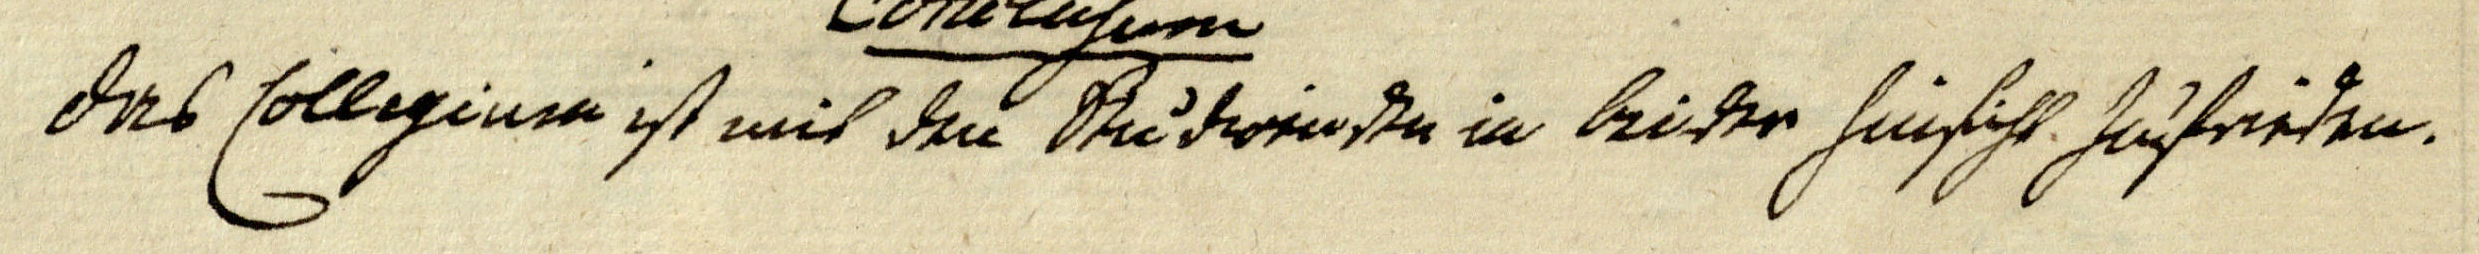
Das Collegium ist mit den Studirenden in beider Hinsicht zufrieden.
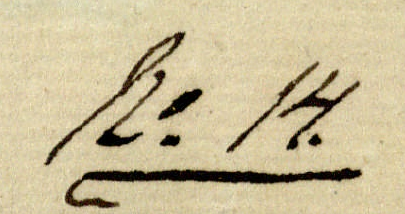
No 14.
